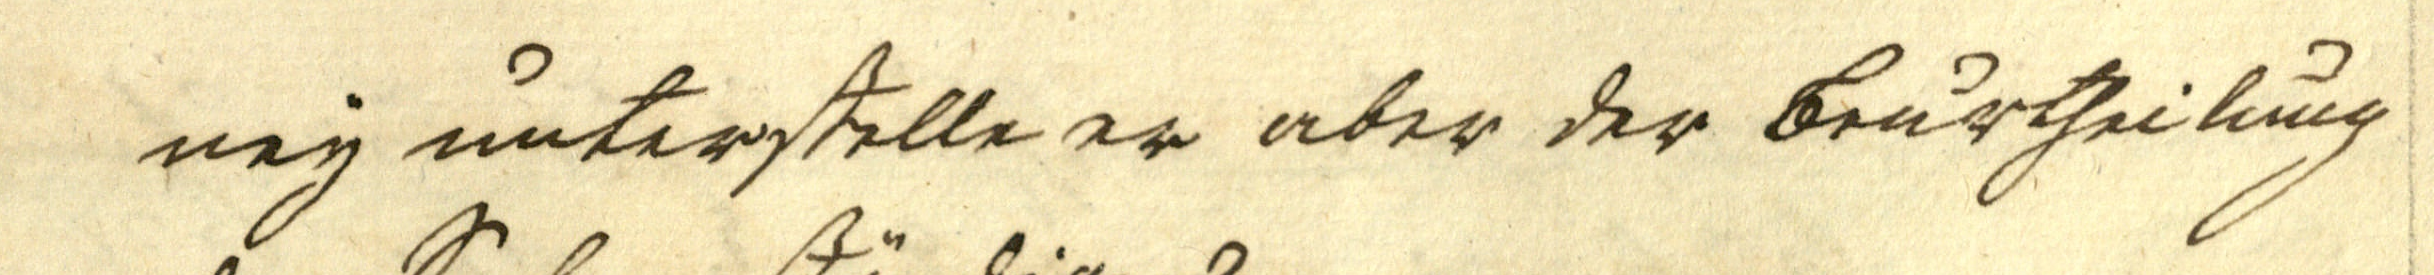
neÿ unterstelle er aber der Beurtheilung
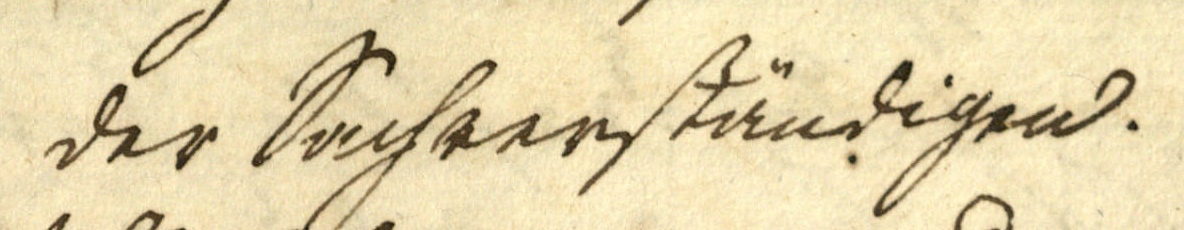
der Sachverständigen.
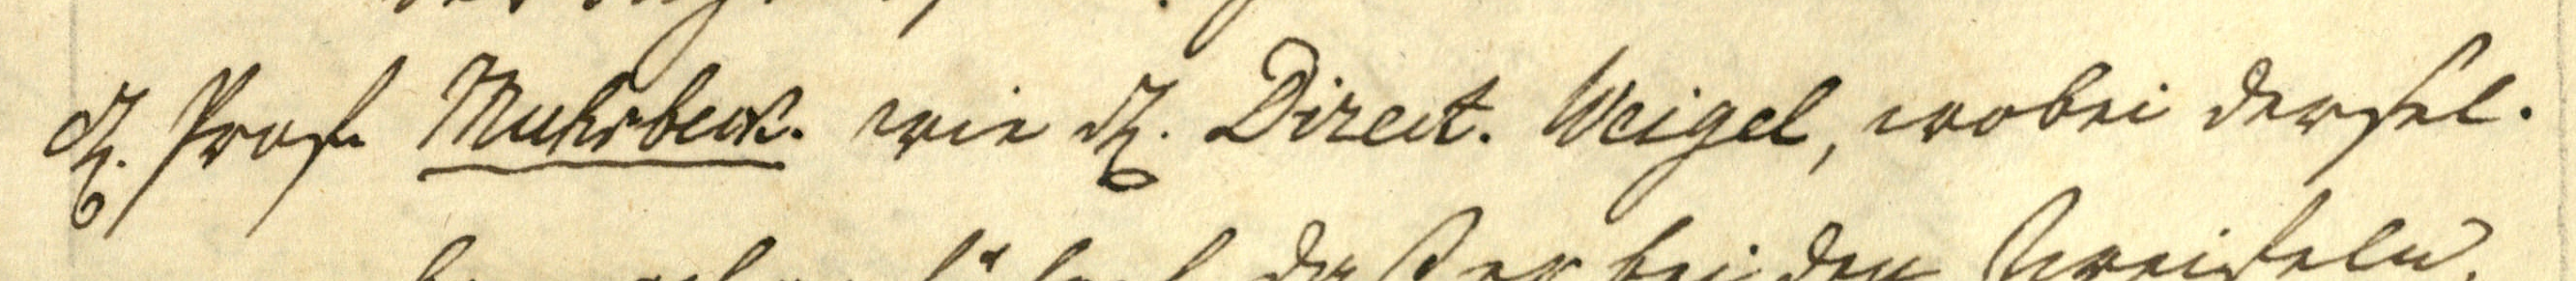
dh. Prof. Muhrbeck. wie dh. Direct. Weigel, wobei dersel¬
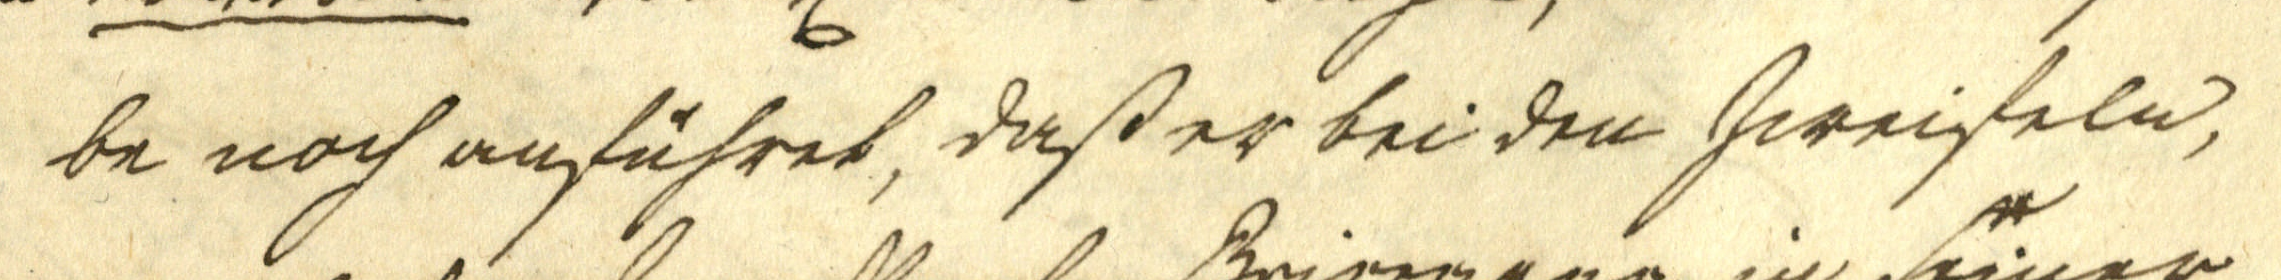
be noch anführet, daß er bei den Zweifeln,
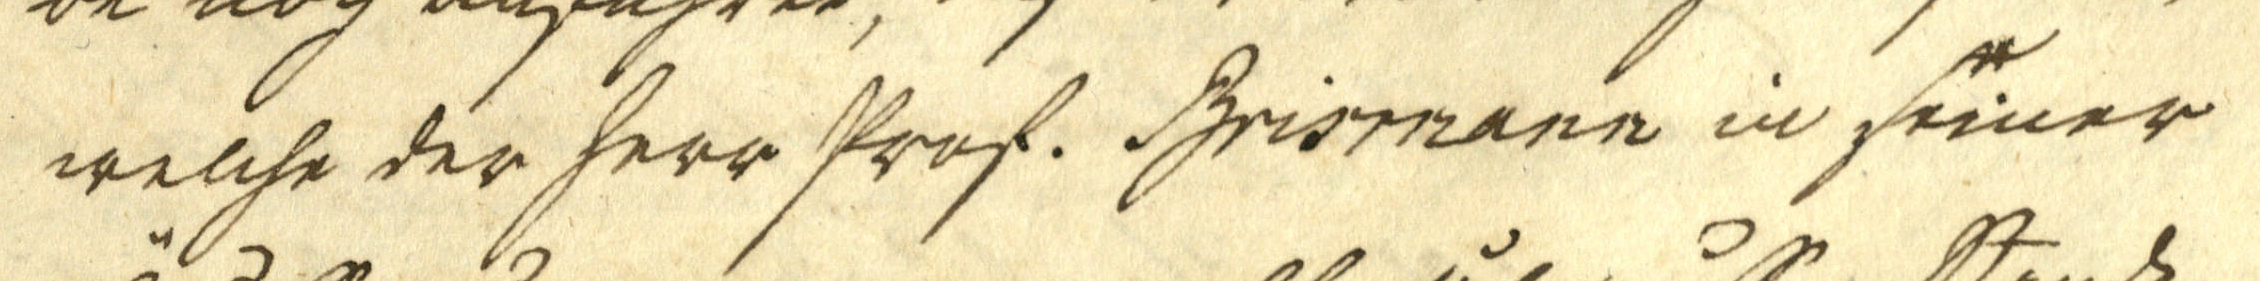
welche der Herr Prof. Brismann in seiner
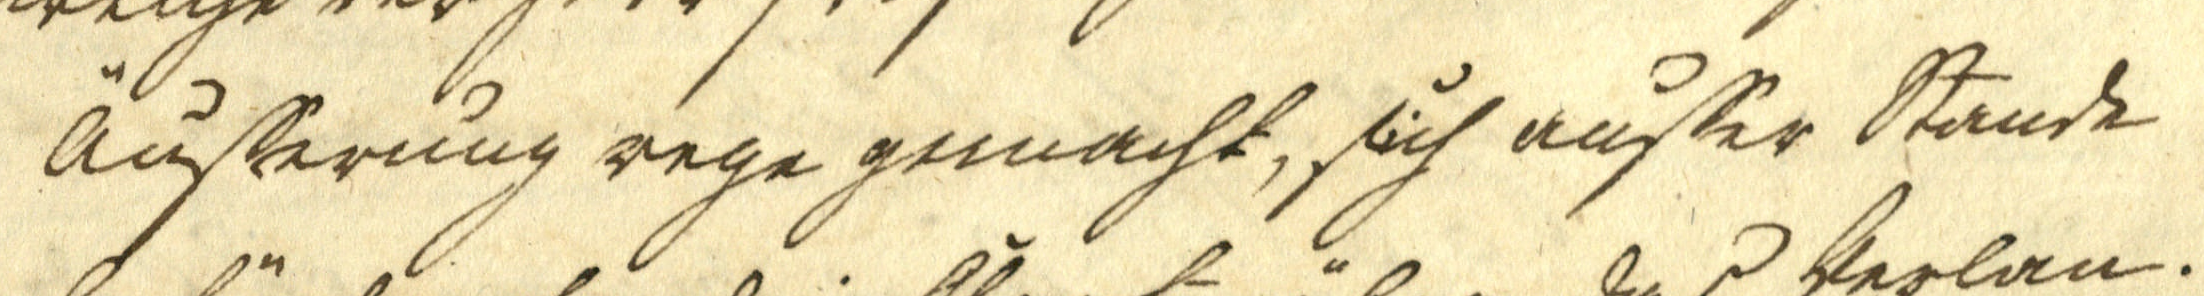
Äusserung rege gemacht, sich ausser Stande
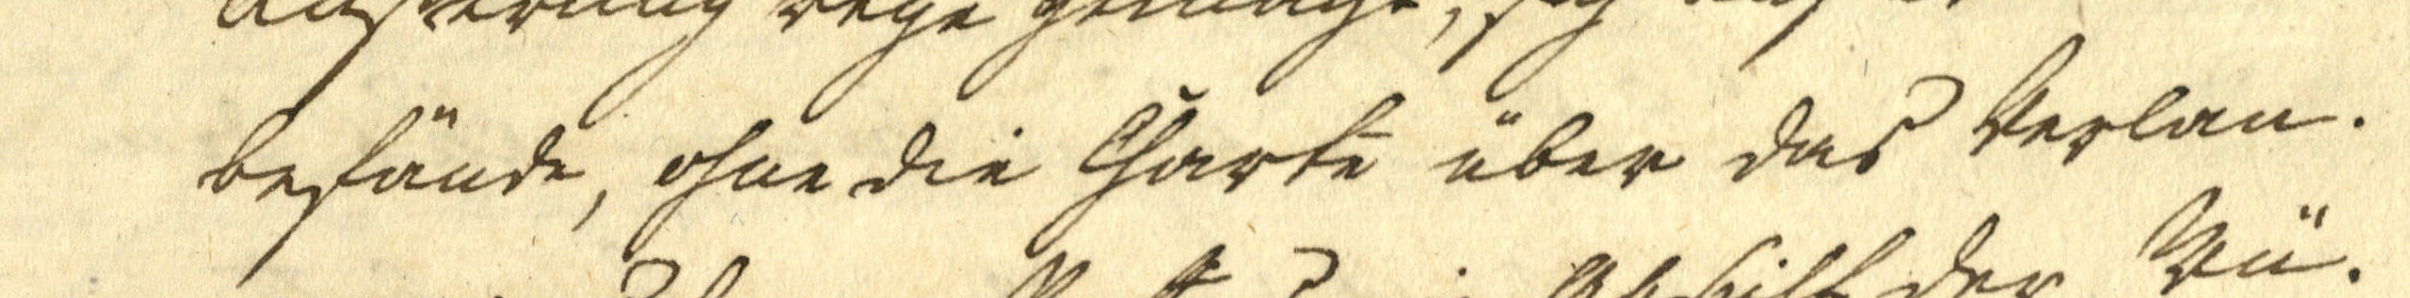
befände, ohne die Charte über das Verlan¬
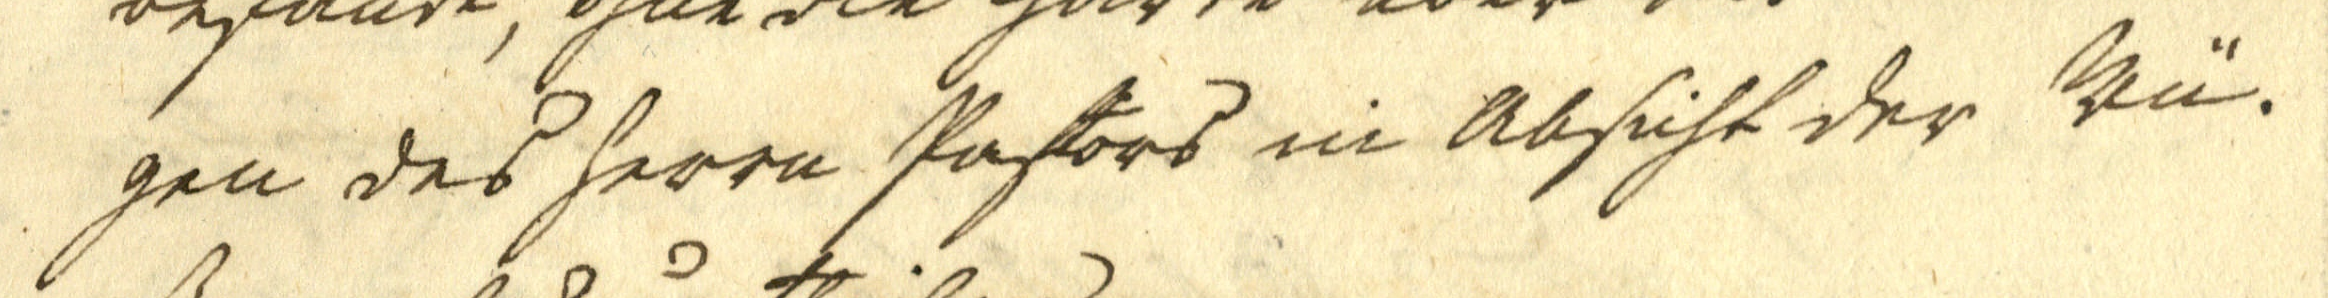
gen des Herrn Pastors in Absicht der Wü¬
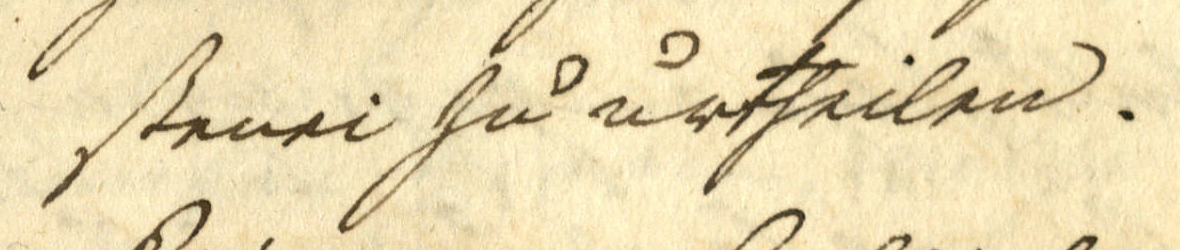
stenei zu urtheilen.
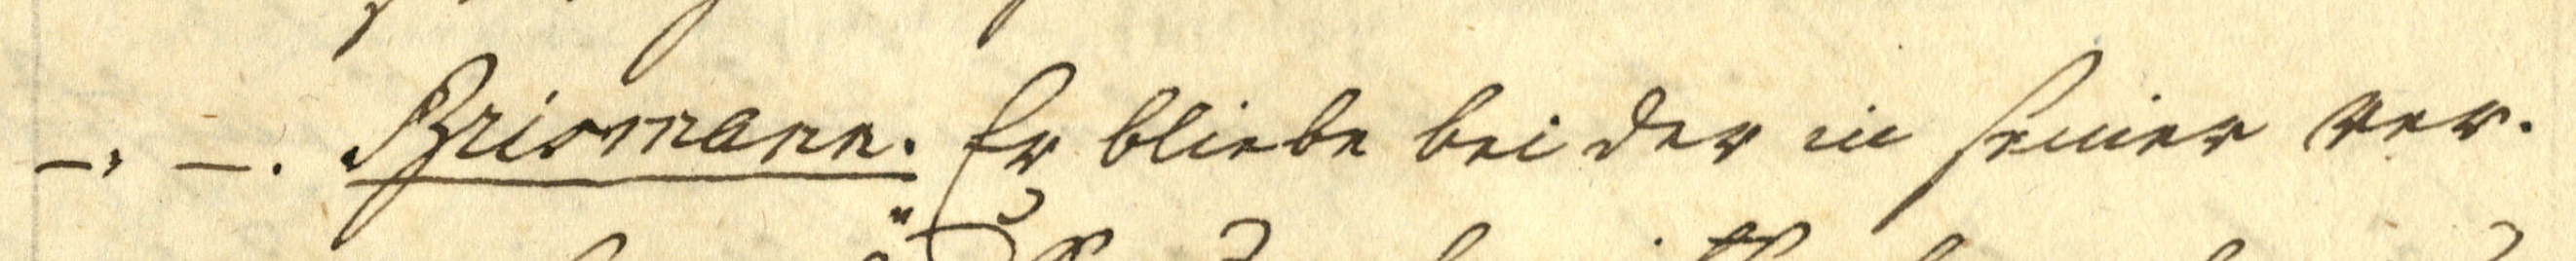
Brismann. Er bliebe bei der in seiner ver¬
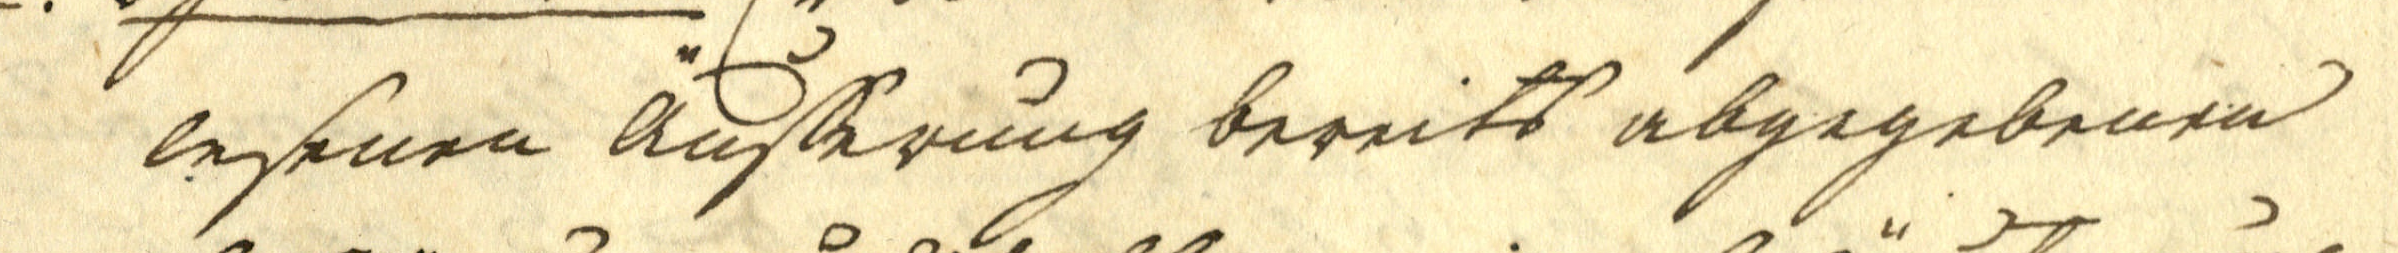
lesenen Äusserung bereits abgegebenen
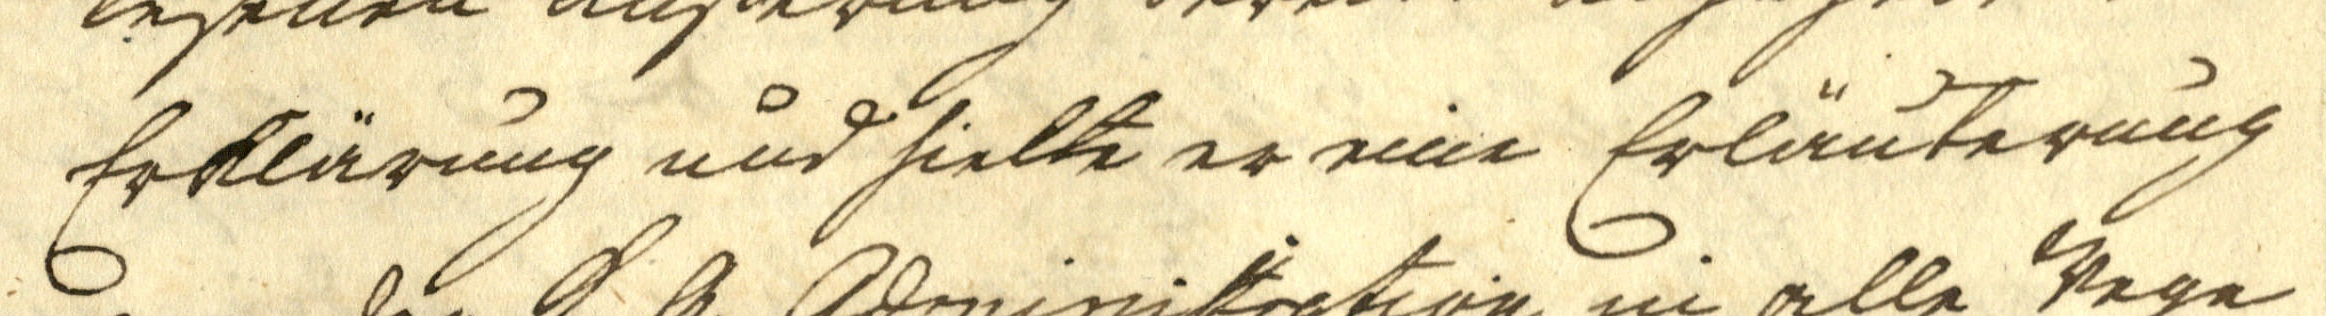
Erklärung und hielte er eine Erläuterung
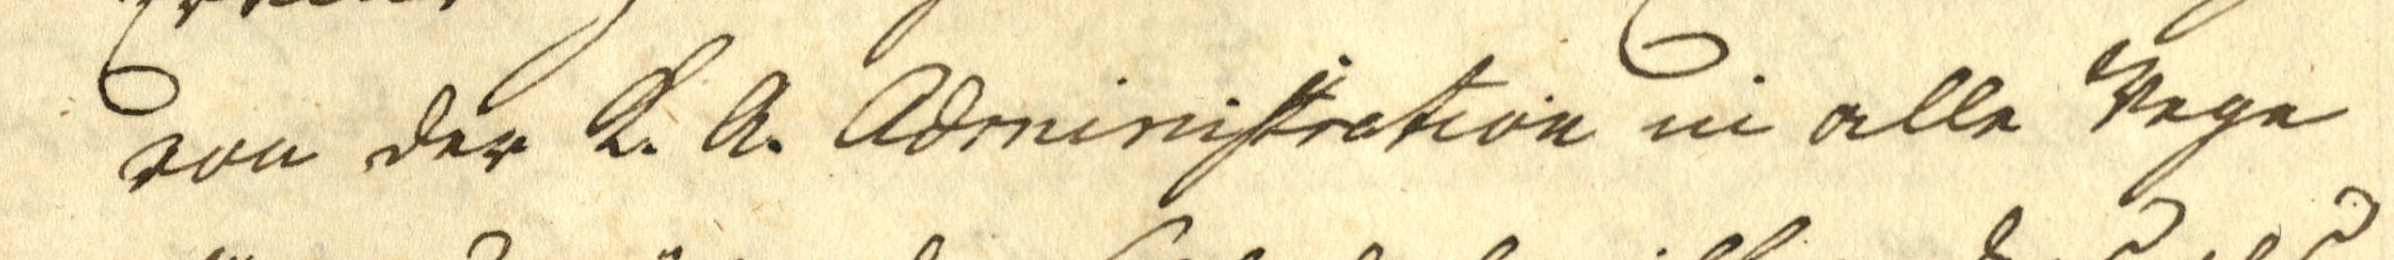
von der K. A. Administration in alle Wege
